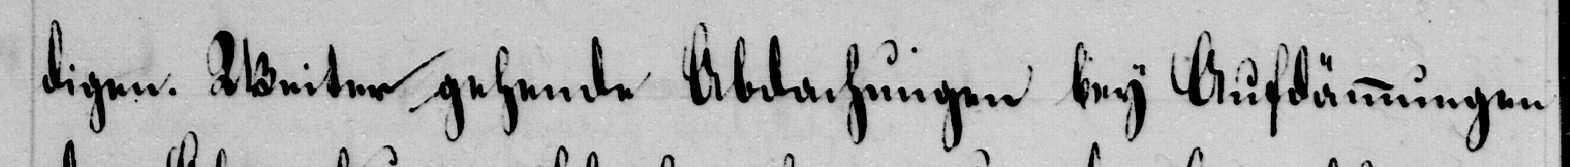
digen. Weiter gehende Abdachungen, bey Aufdämmungen
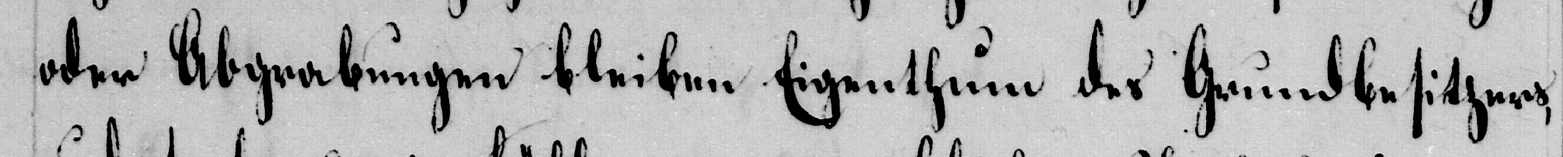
oder Abgrabungen bleiben Eigenthum des Grundbesitzers,
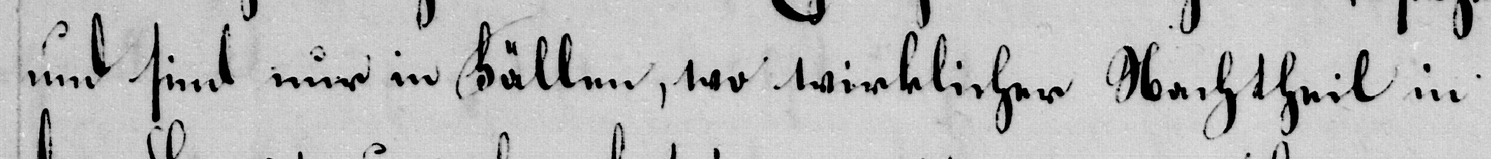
und sind nur in Fällen, wo wirklicher Nachtheil in
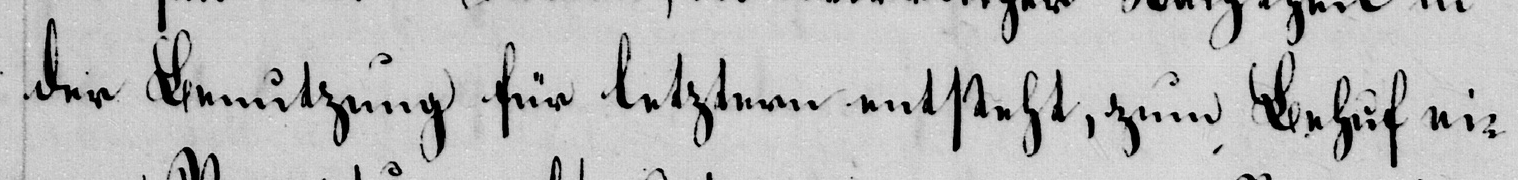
der Benutzung für letztern entsteht, zum Behuf ei¬
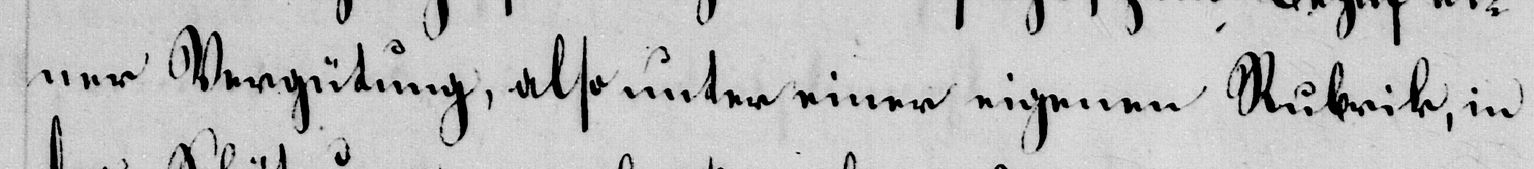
ner Vergütung, also unter einer eigenen Rubrik, in
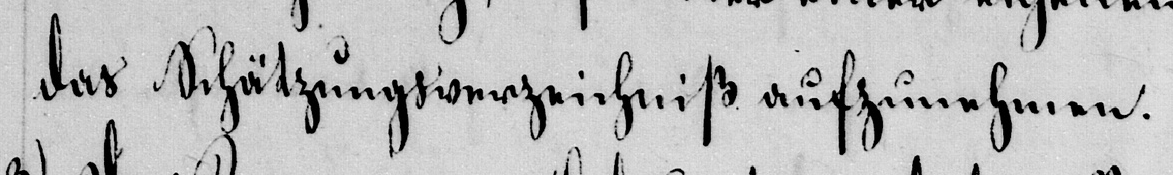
das Schätzungsverzeichniß aufzunehmen.
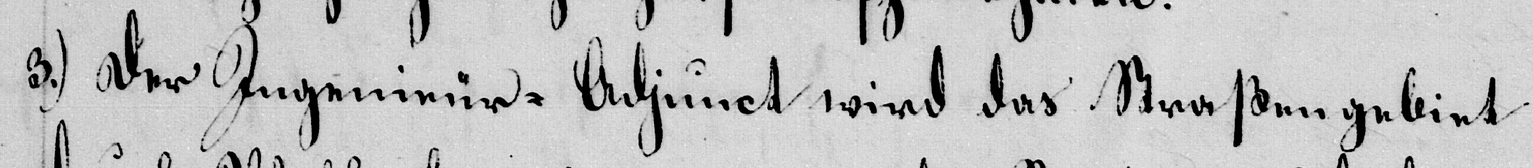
3.) Der Ingenieur-Adjunct wird das Straßengebiet
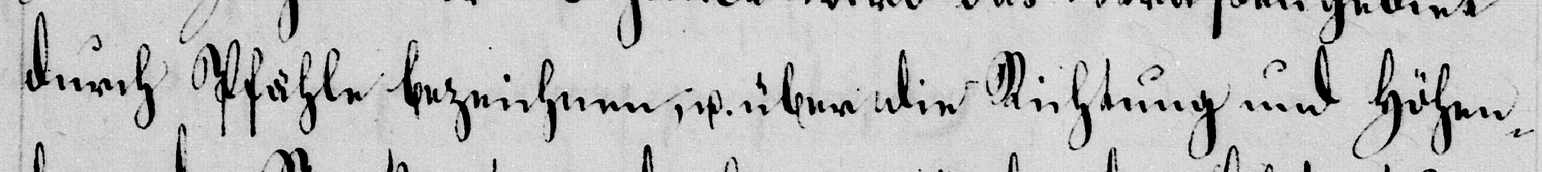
durch Pfähle bezeichnen u. über die Richtung und Höhen¬
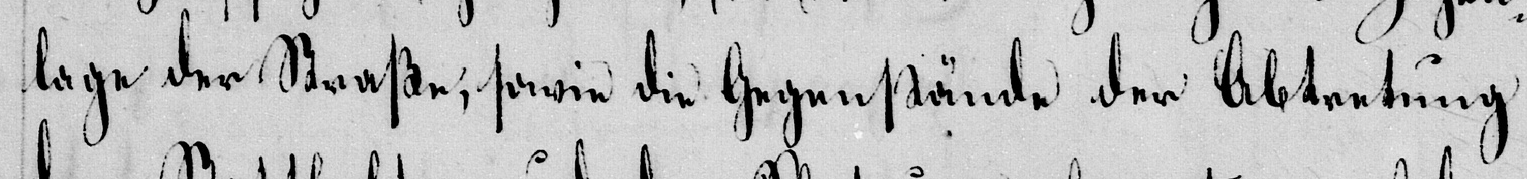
lage der Straße, sowie die Gegenstände der Abtretung
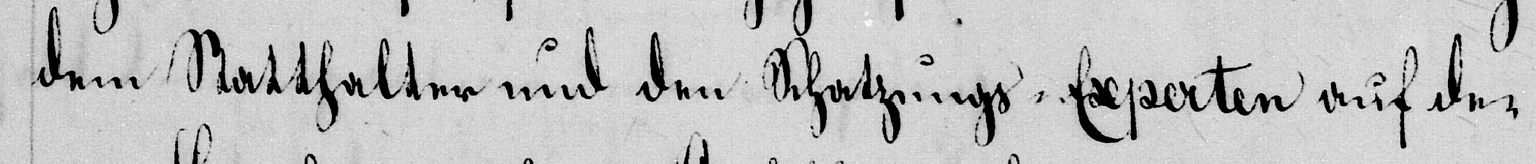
dem Statthalter und den Schatzungs-Experten auf de¬
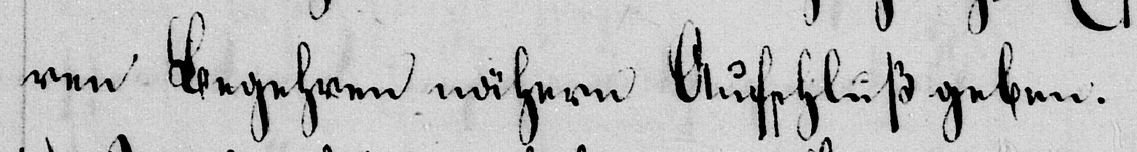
ren Begehren nähern Aufschluß geben.
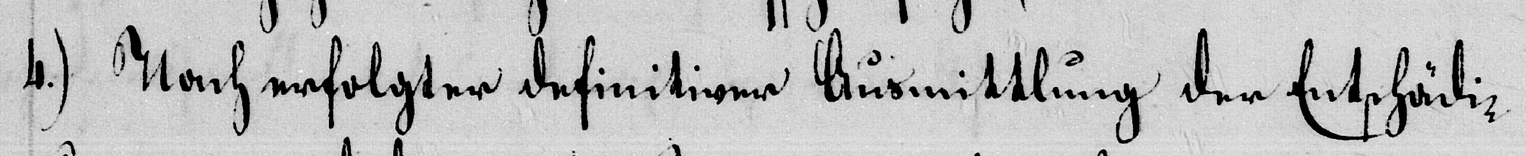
4.) Nach erfolgter definitiver Ausmittlung der Entschädi¬
